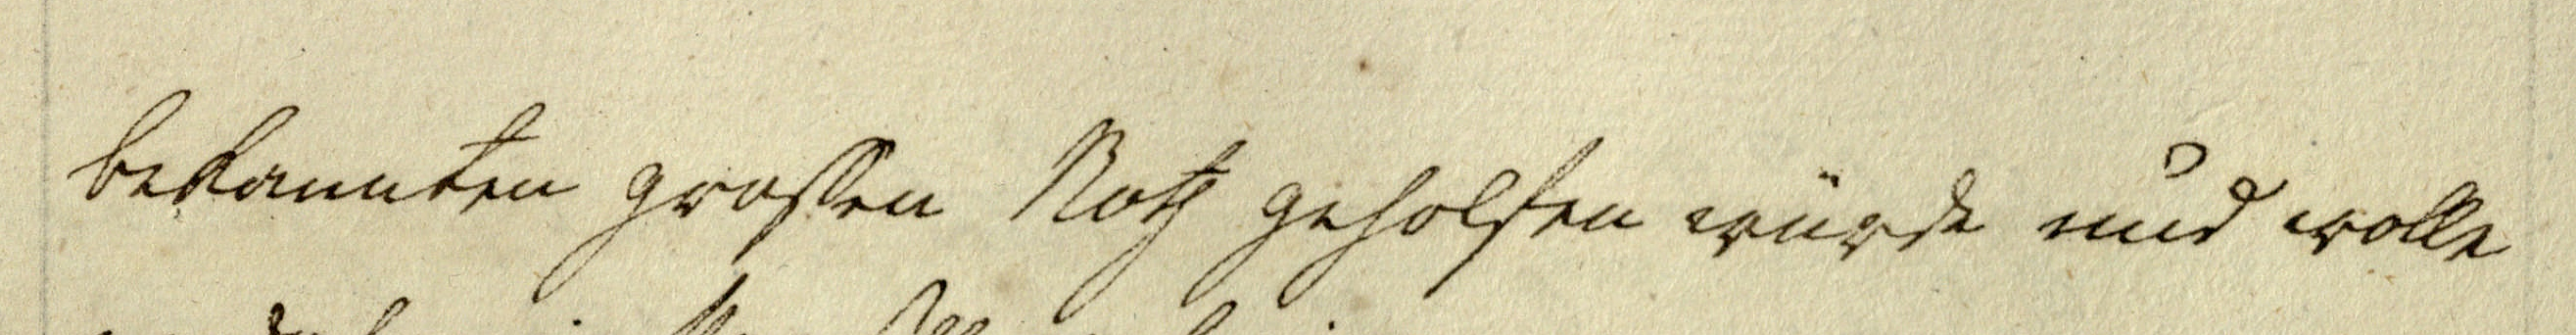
bekannten grossen Noth geholfen würde und wolle
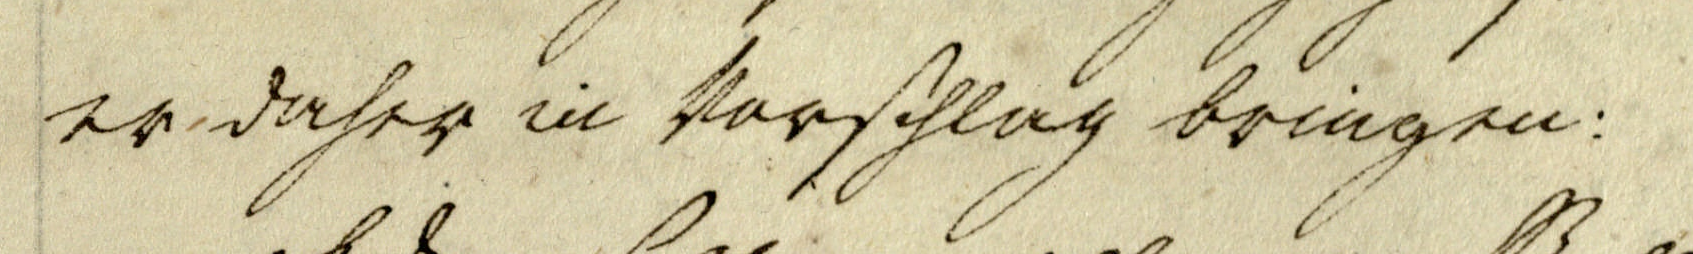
er daher in Vorschlag bringen:
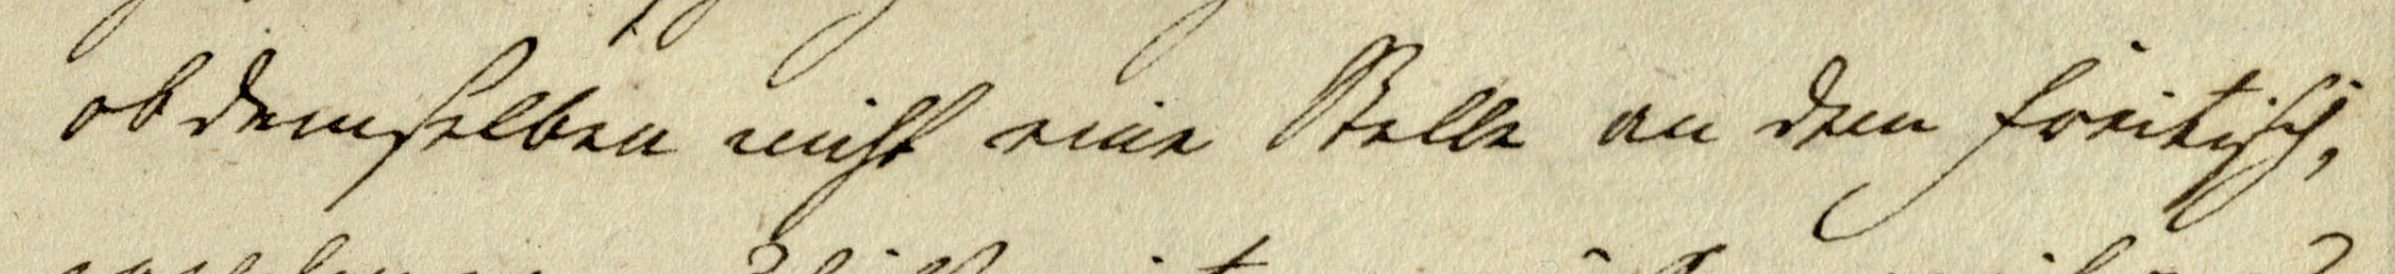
ob demselben nicht eine Stelle an dem Freitisch,
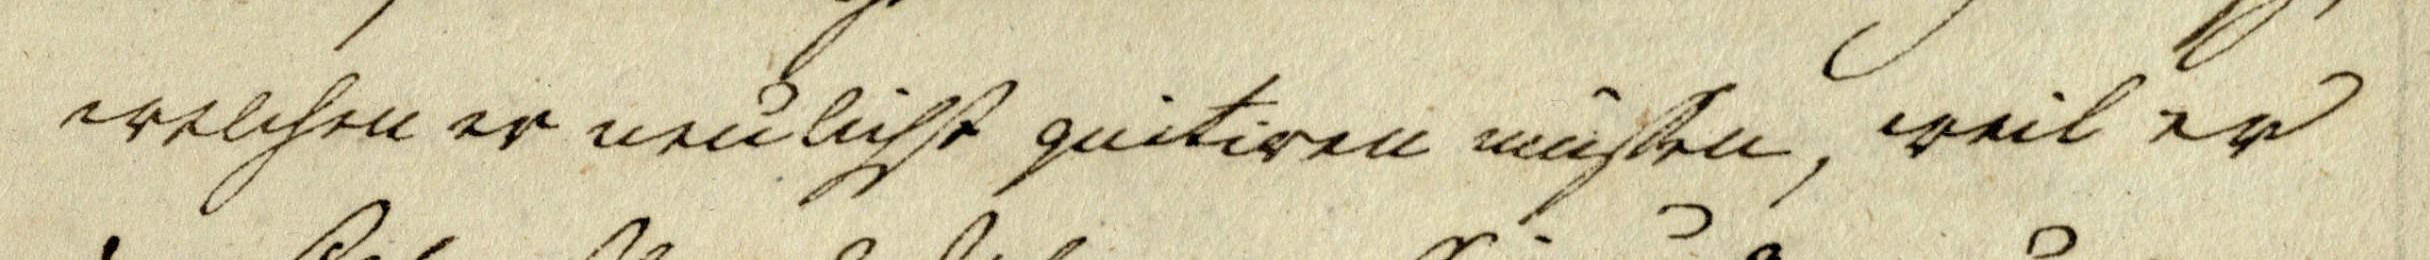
welchen er neulichst quitiren müssen, weil er
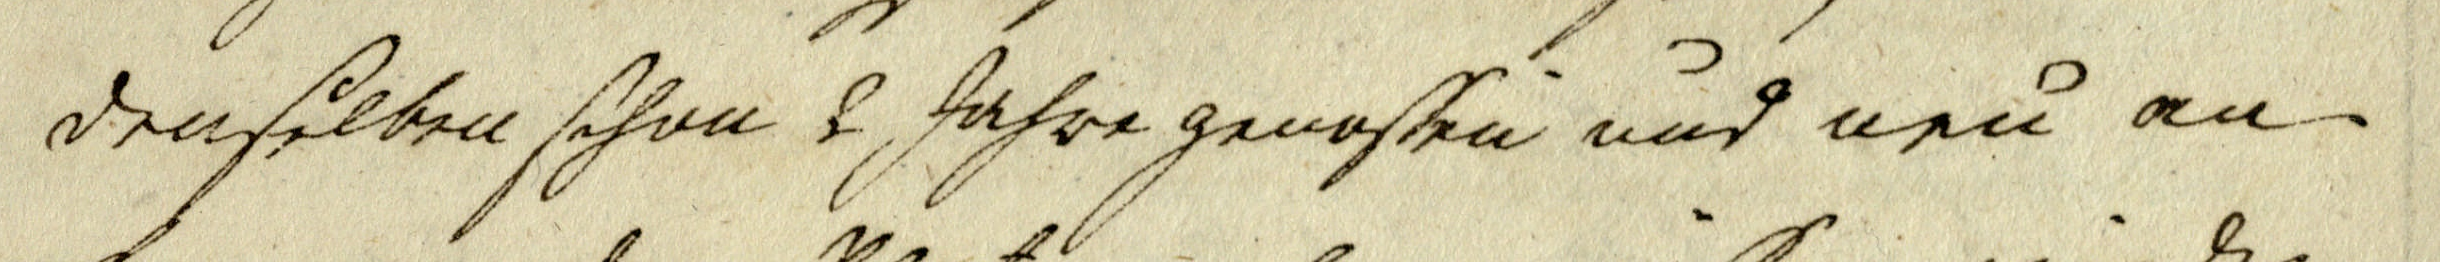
denselben schon 2 Jahre genossen und neu an¬
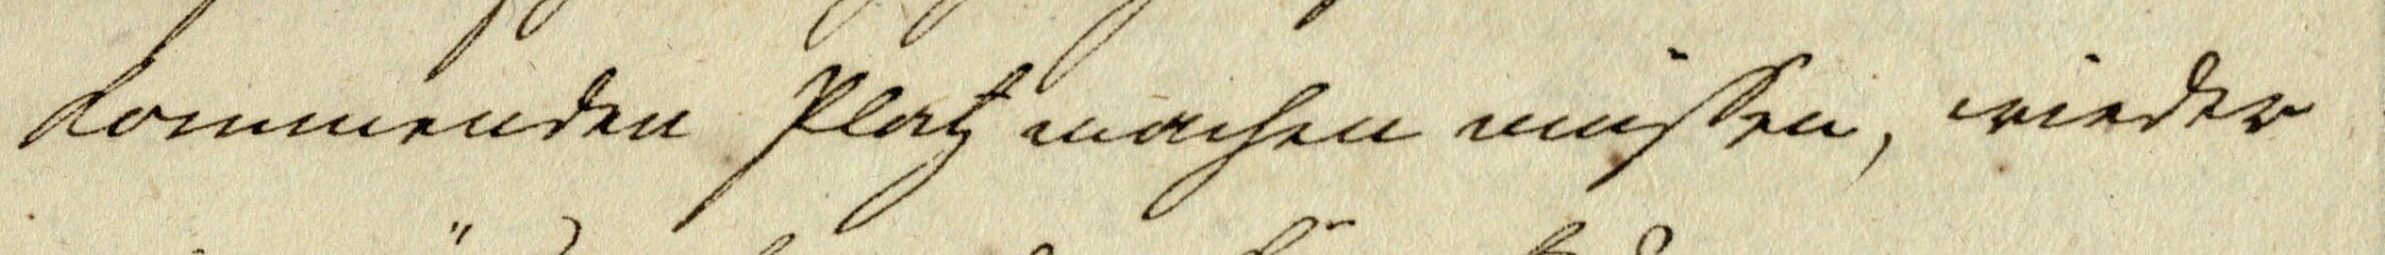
kommenden Platz machen müssen, wieder
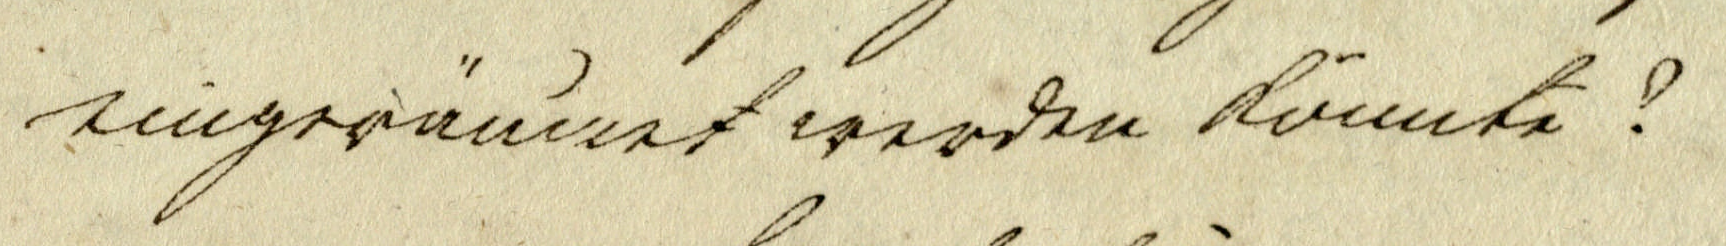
eingeräumet werden könnte ?
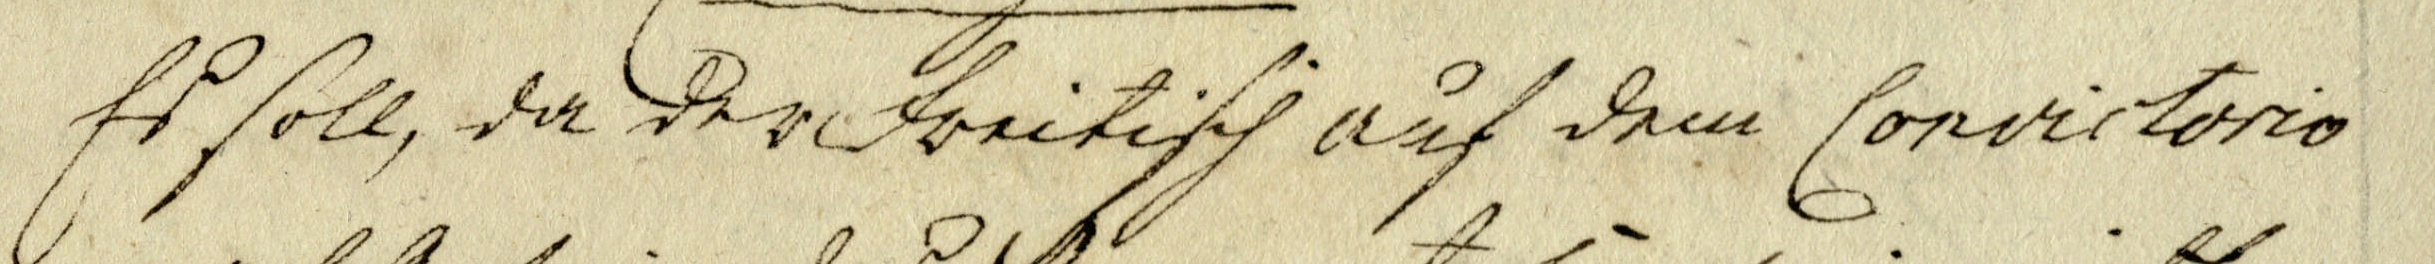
Es soll, da der Freitisch auf dem Convictorio
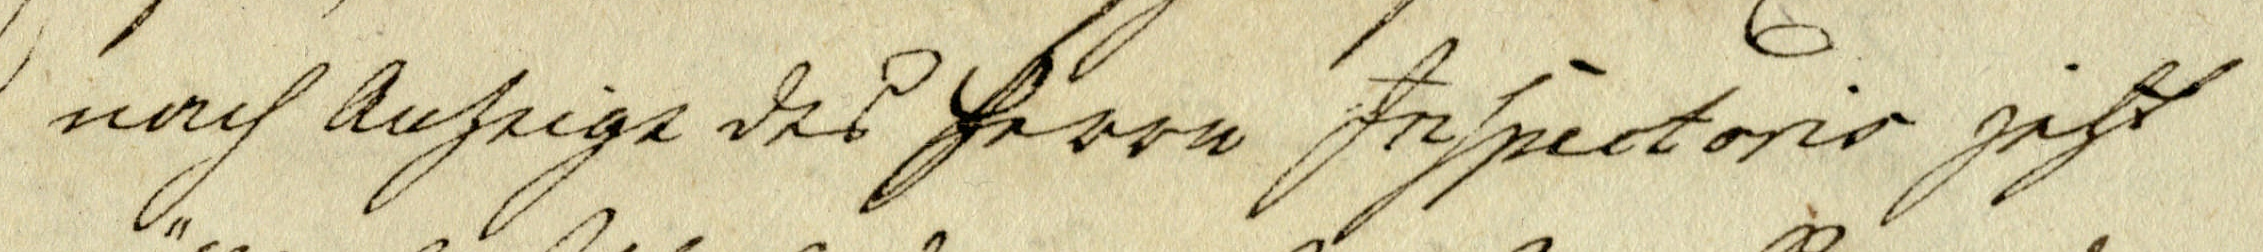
nach Anzeige des Herrn Inspectoris jetzt
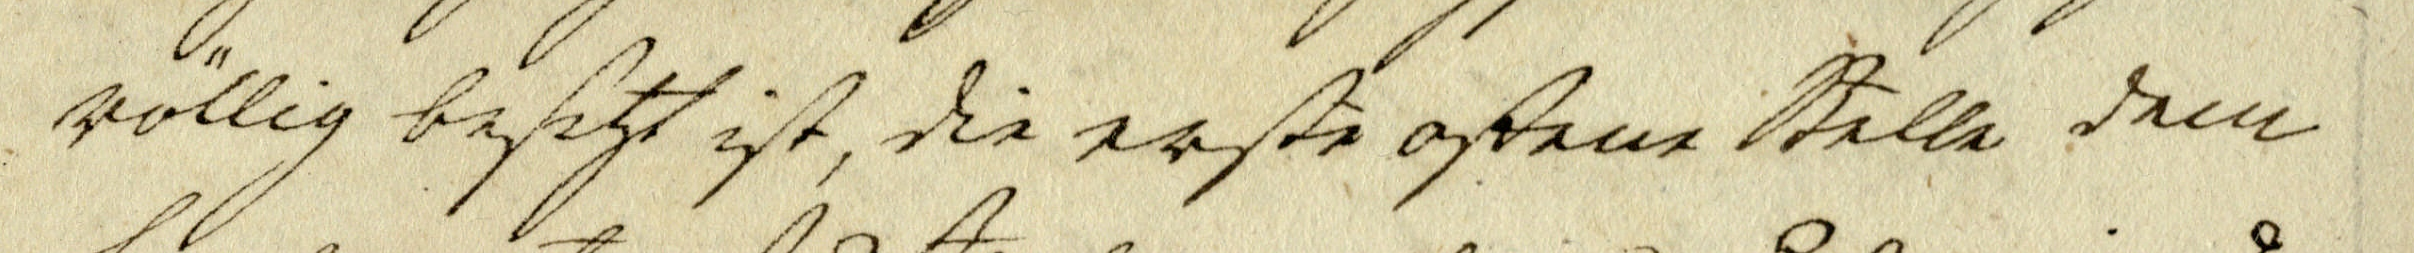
völlig besetzt ist, die erste offene Stelle dem
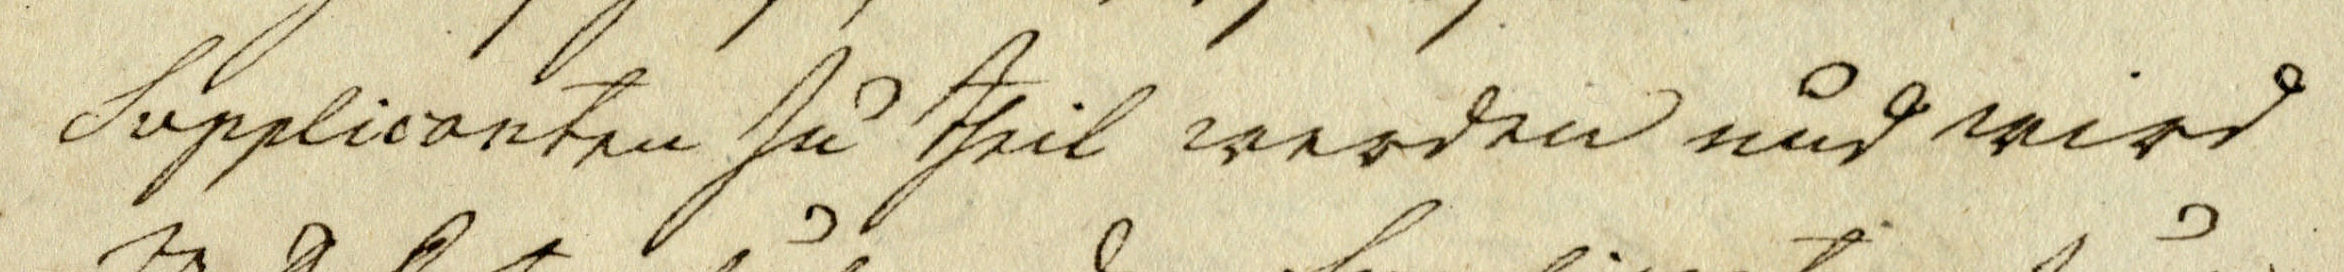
Supplicanten zu Theil werden und wird
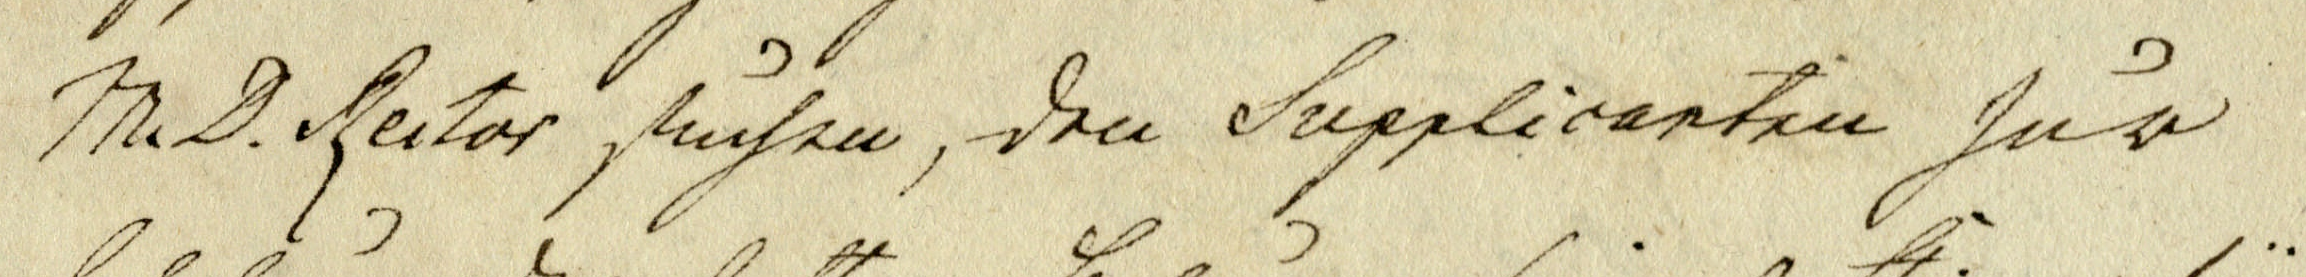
M. D. Rector suchen, den Supplicanten zur
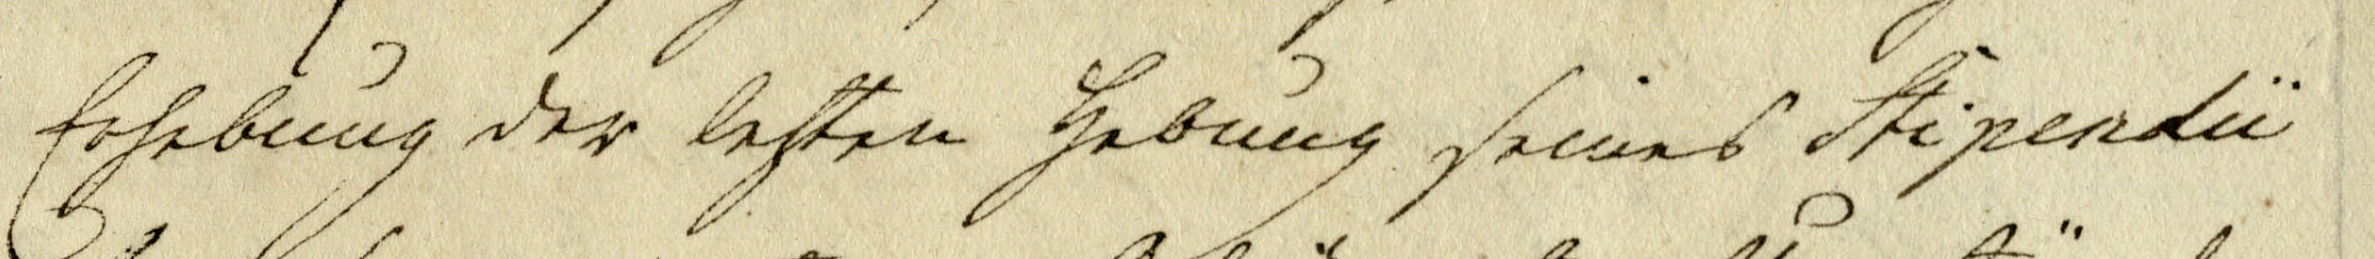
Erhebung der letzten Hebung seines Stipendii
